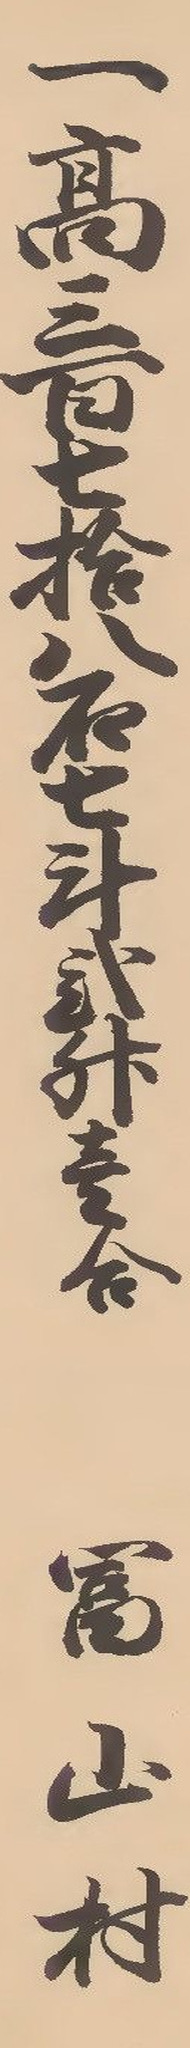一高三百七拾八石七斗弐升壱合富山村

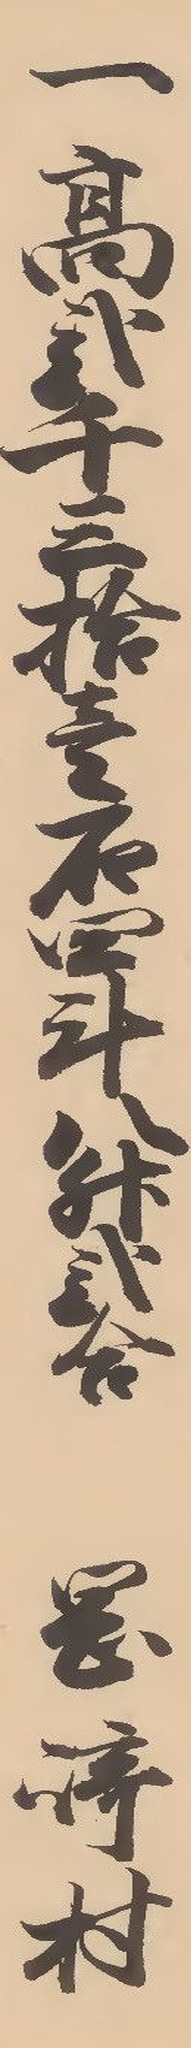一高弐千三拾壱石四斗八升弐合岡崎村
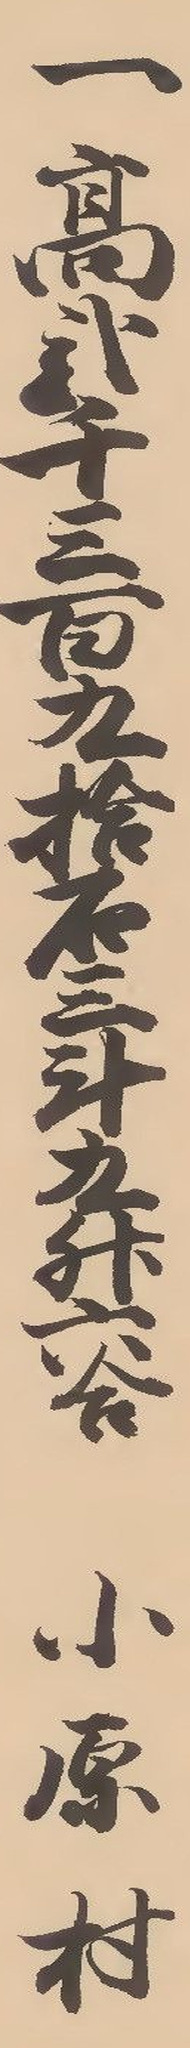一高弐千三百九拾石三斗九升六合小原村
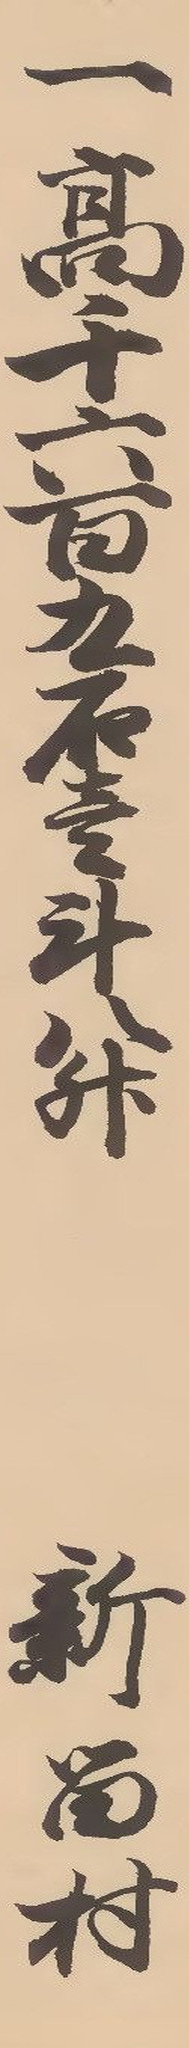一高千六百九石壱斗八升新留村
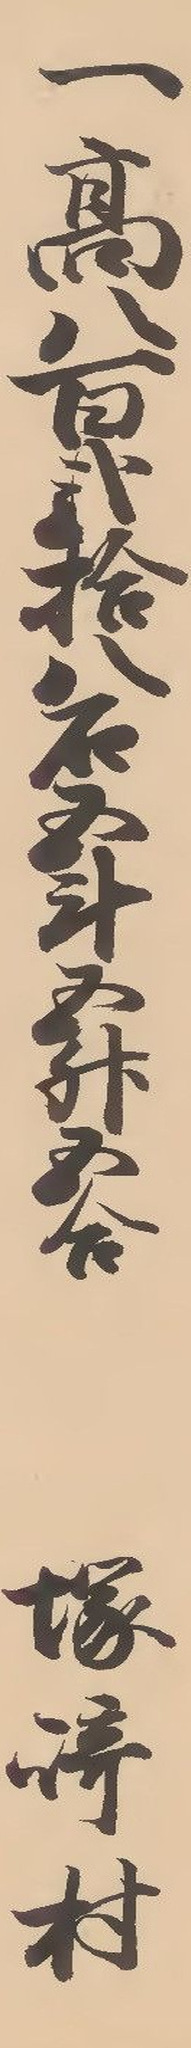一高八百弐拾八石五斗五升五合塚崎村
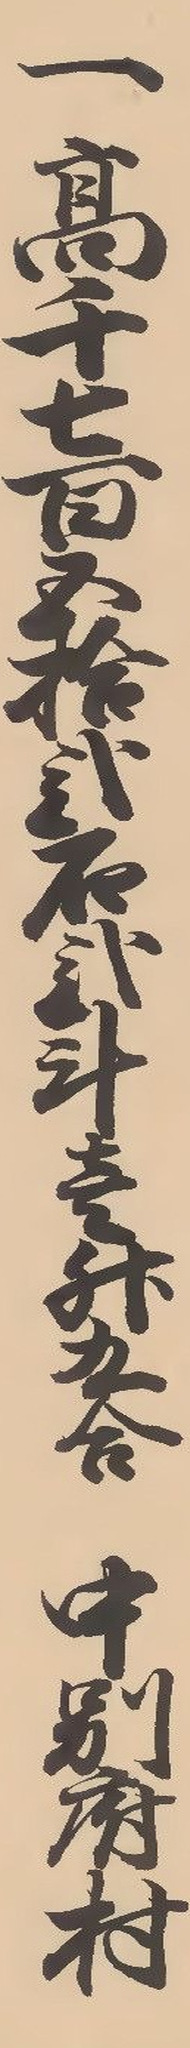一高千七百五拾弐石弐斗壱升九合中別府村
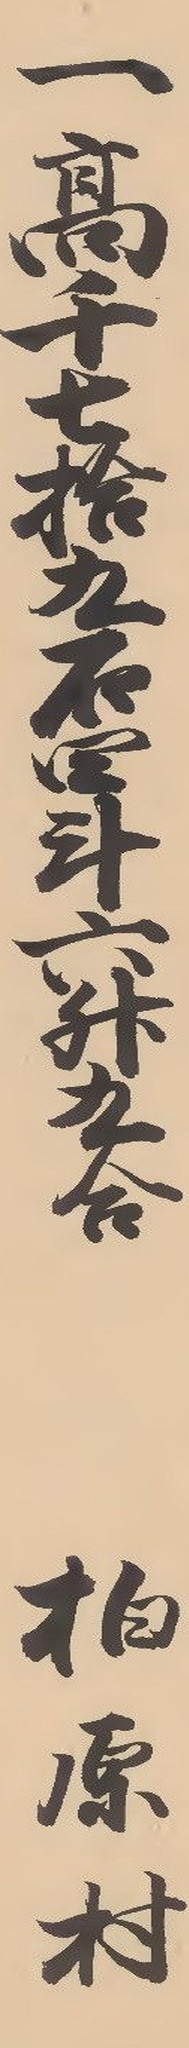一高千七拾九石四斗六升九合柏原村
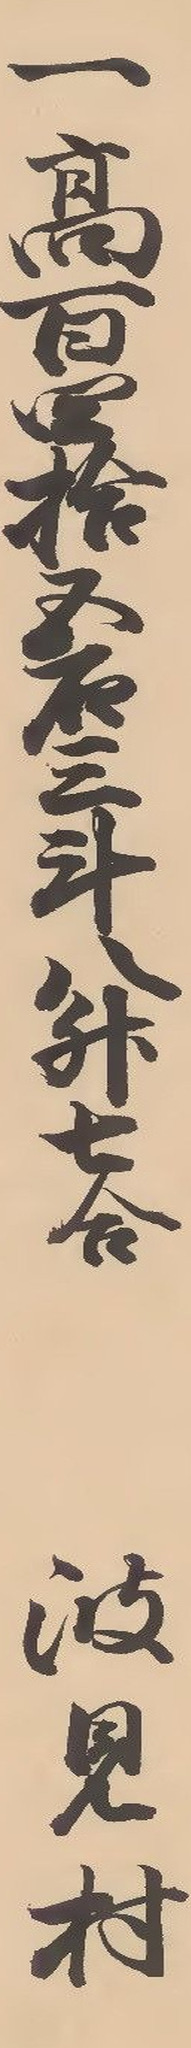一高百四拾五石三斗八升七合渋見村
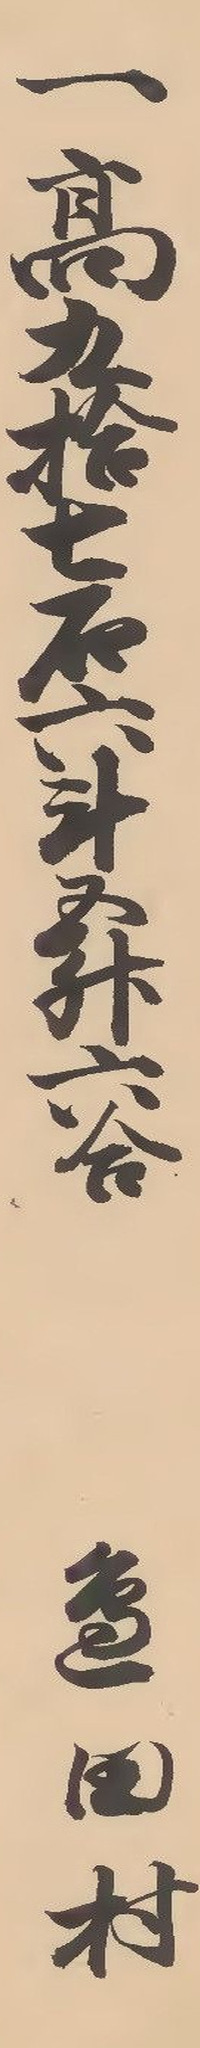一高九拾七石六斗五升六合辺田村

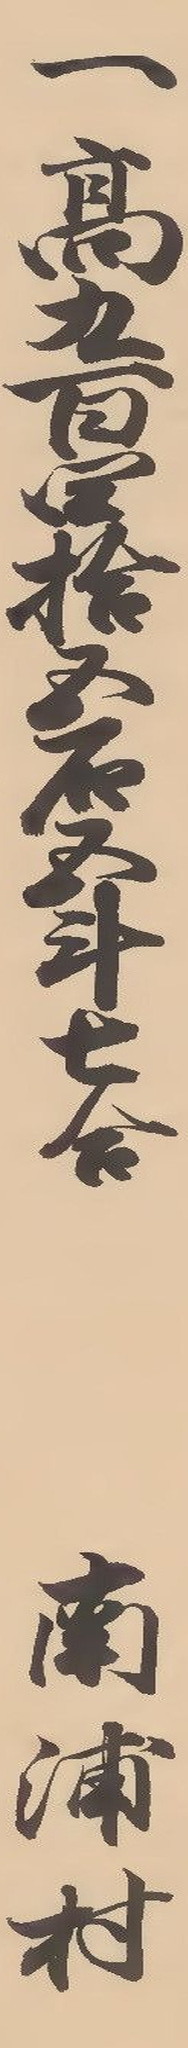一高九百四拾五石五斗七合南浦村
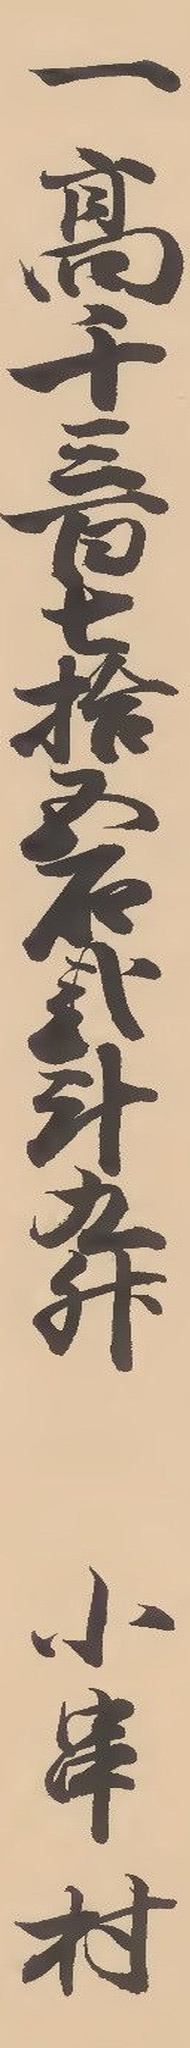一高千三百七拾五石弐斗九升小串村
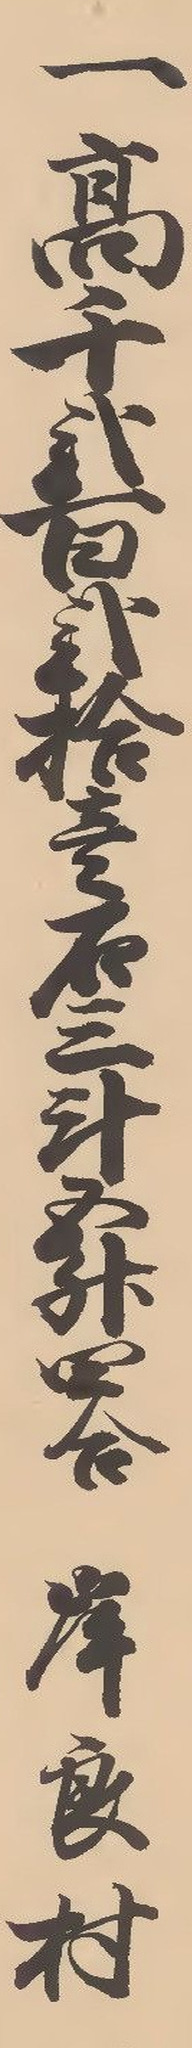一高千弐百弐拾壱石三斗五升四合岸良村
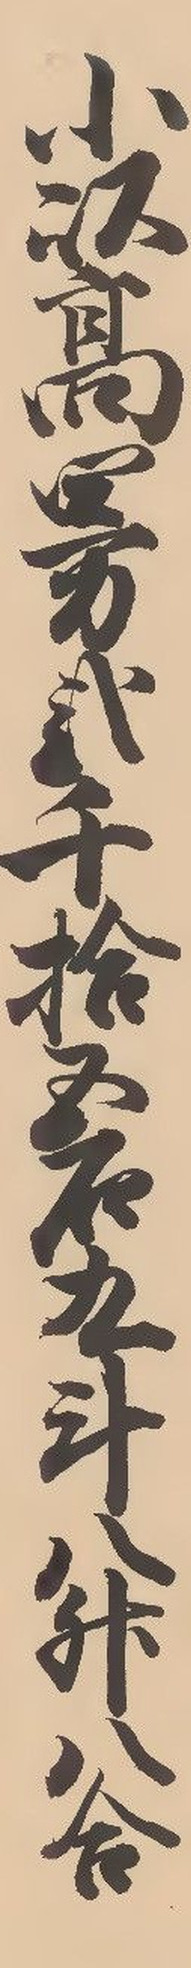小以高四万弐千拾五石九斗八升八合

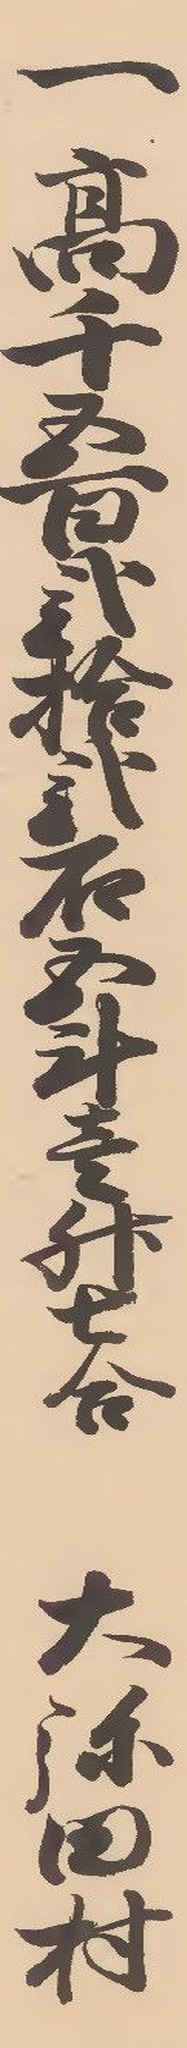一高千五百弐拾弐石五斗壱升七合大弥田村
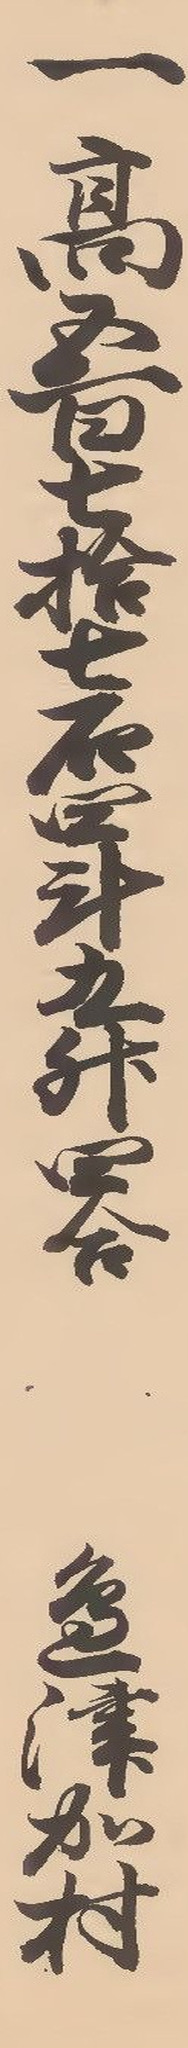一高五百七拾七石四斗九升四合辺津加村
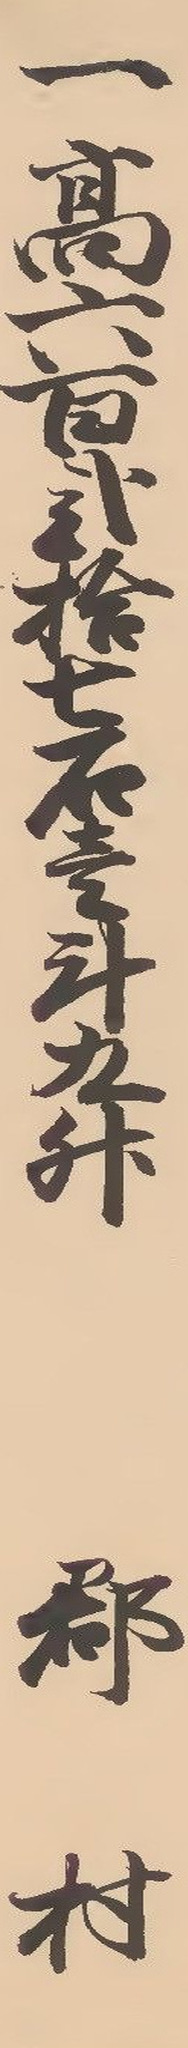一高六百弐拾七石壱斗九升郡村
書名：大隅国郷帳
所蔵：国立公文書館 National Archives of Japan
